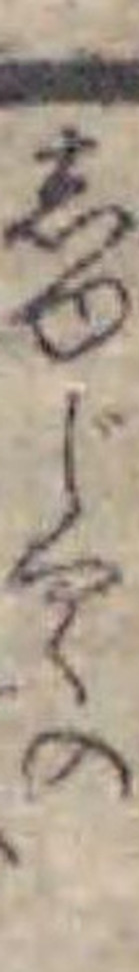しゆじやくの
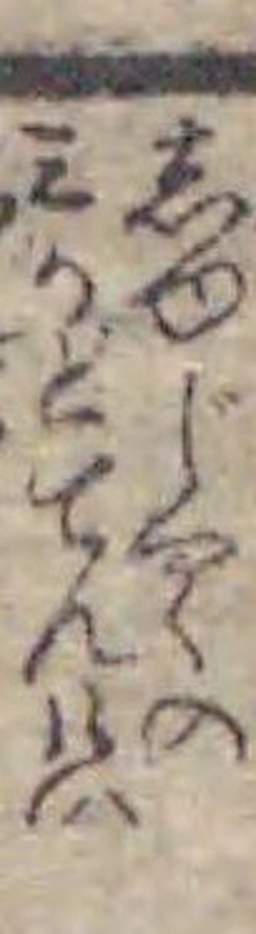みかどてんけい
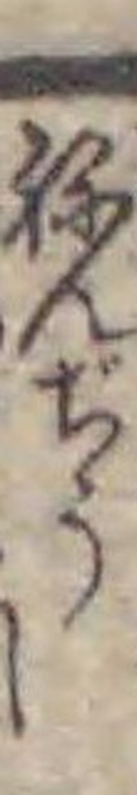ねんぢう
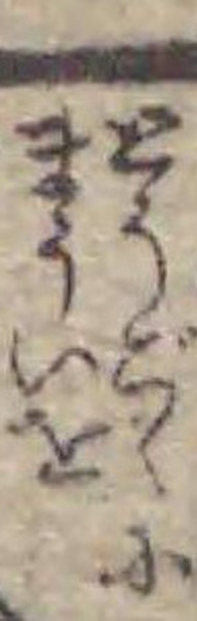まういを
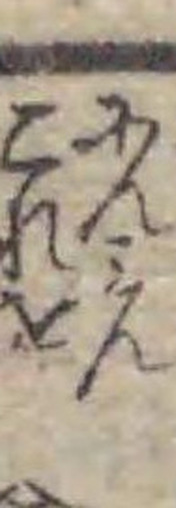これを
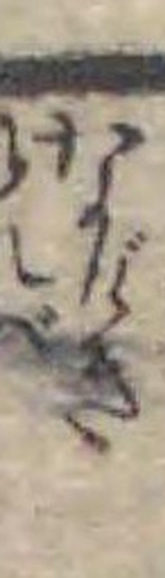なげき
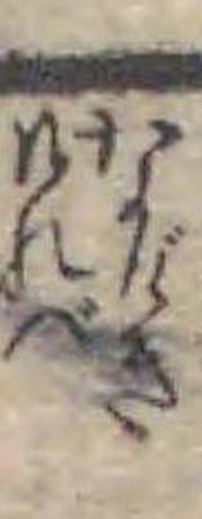ければ
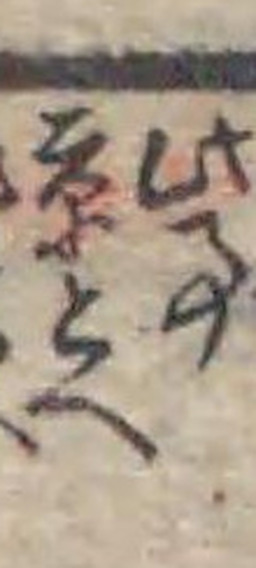京とへ
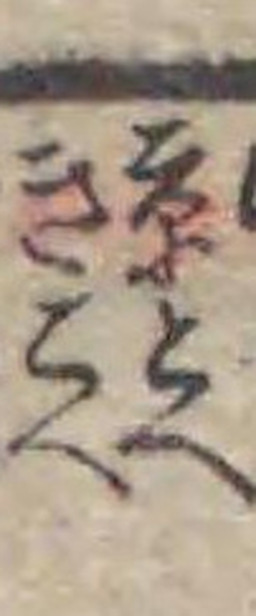きこへ
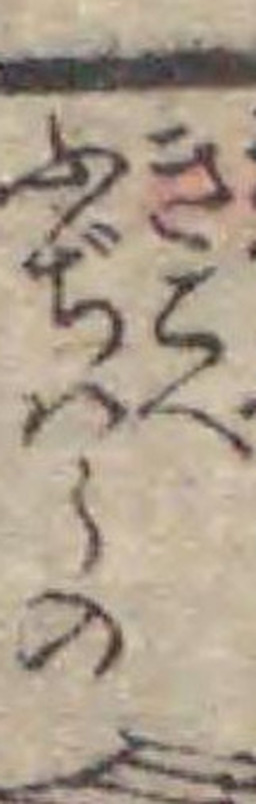ふじはらの
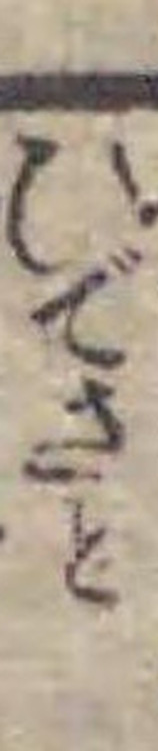ひでさと
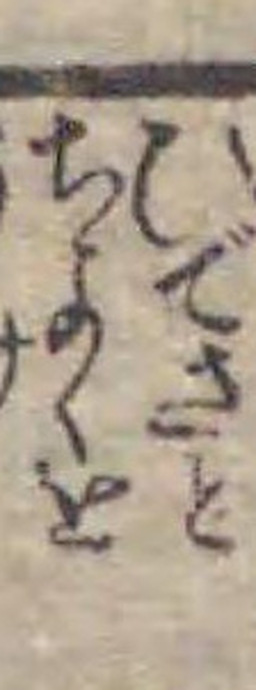ちよくを
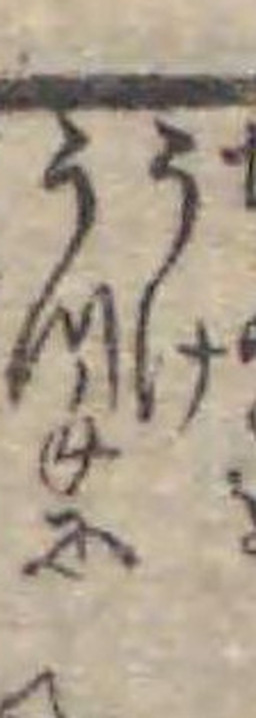うつ手に
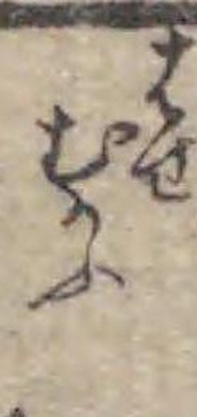むかふ
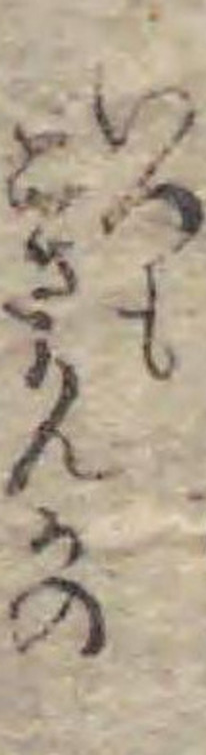ごさかんかの
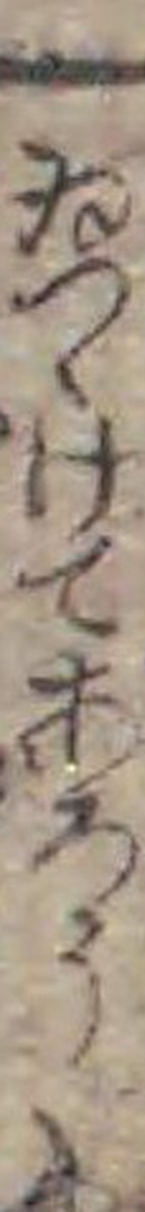ゐつゝけであろう
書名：時代世話二挺皷 : 2巻
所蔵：国立国会図書館 National Diet Library, JAPAN
